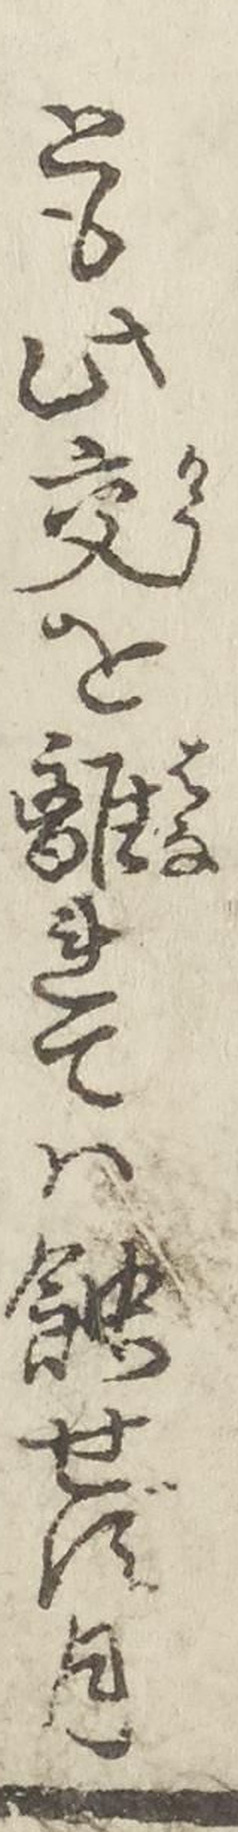とも此交を離れては蝕せず月
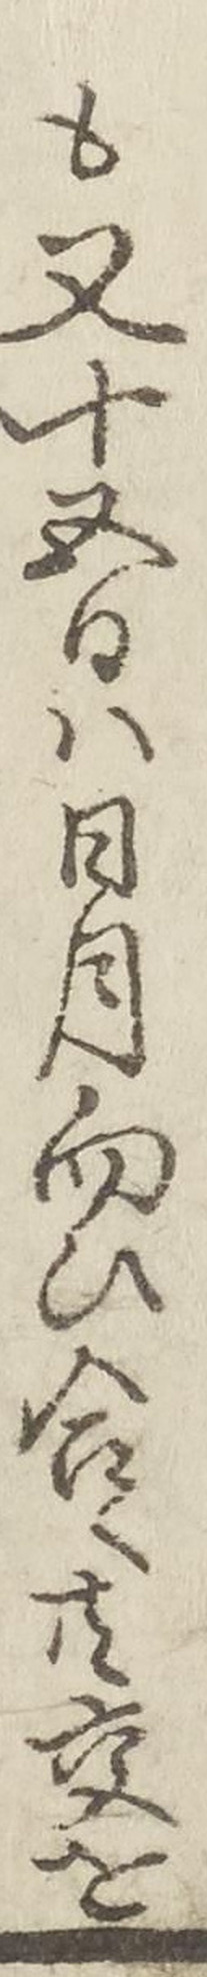も又十五日は日月向ひ合へ共交を
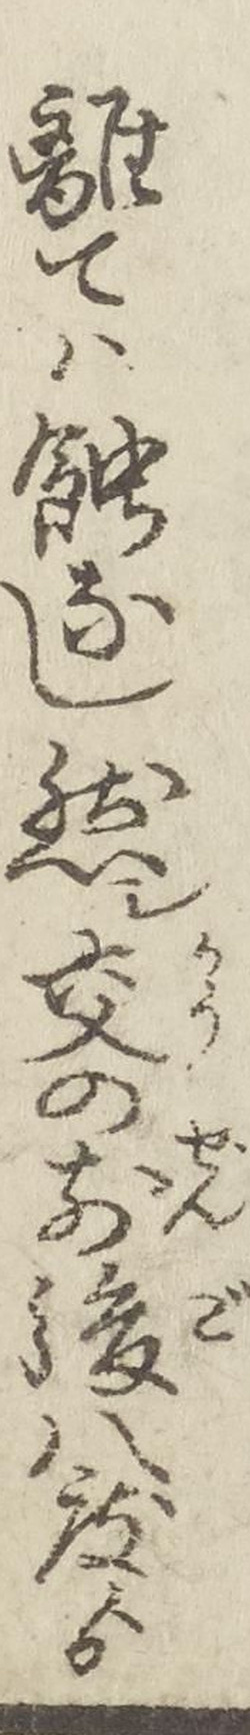離ては蝕なし然シ交の前後八度ゟ
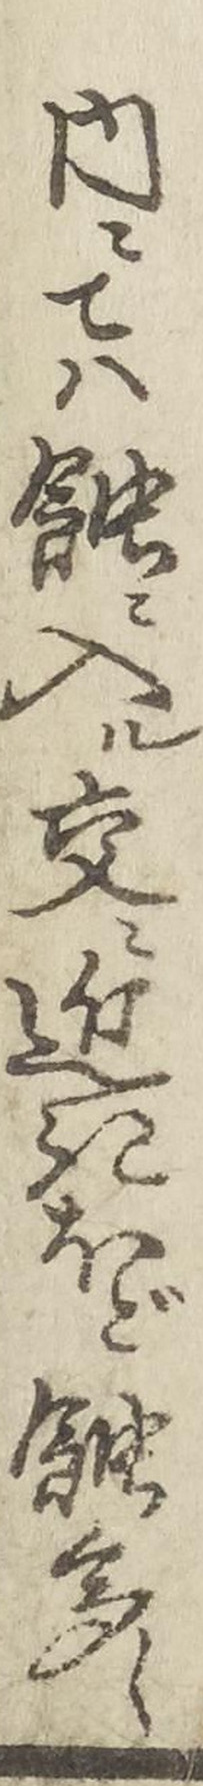内ニては蝕ニ入ル交ニ近きほど蝕多し

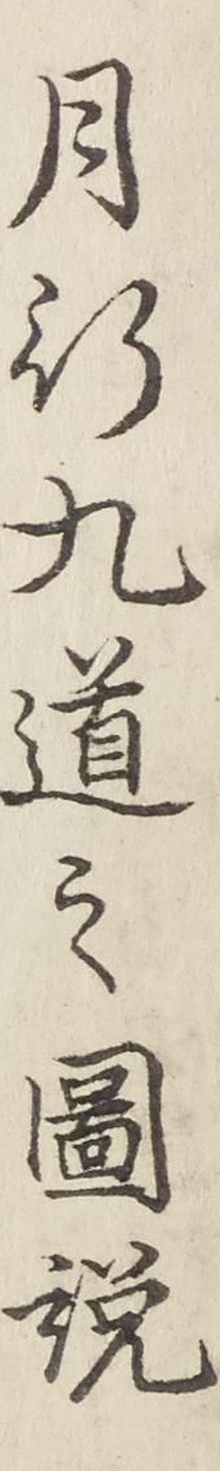月行九道之図説
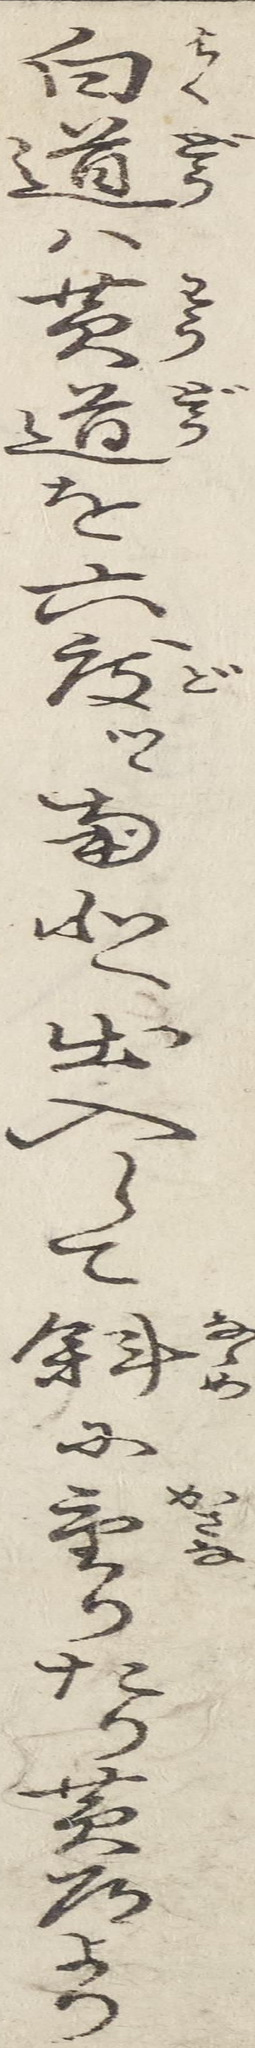白道は黄道を六度つゝ南北へ出入して斜に重りたり黄道より
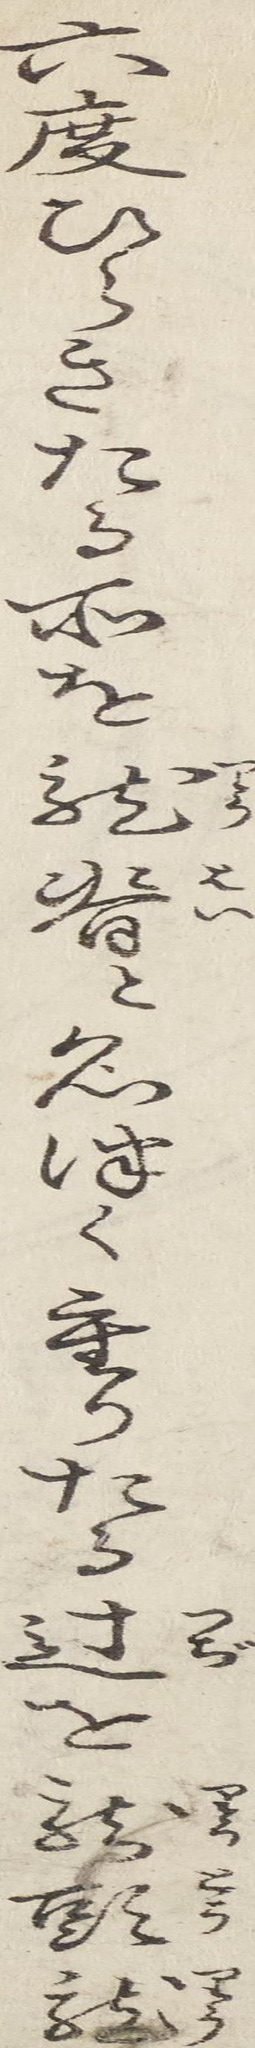六度ひらきたる所を龍背と名つく重なりたる辻を龍頭龍
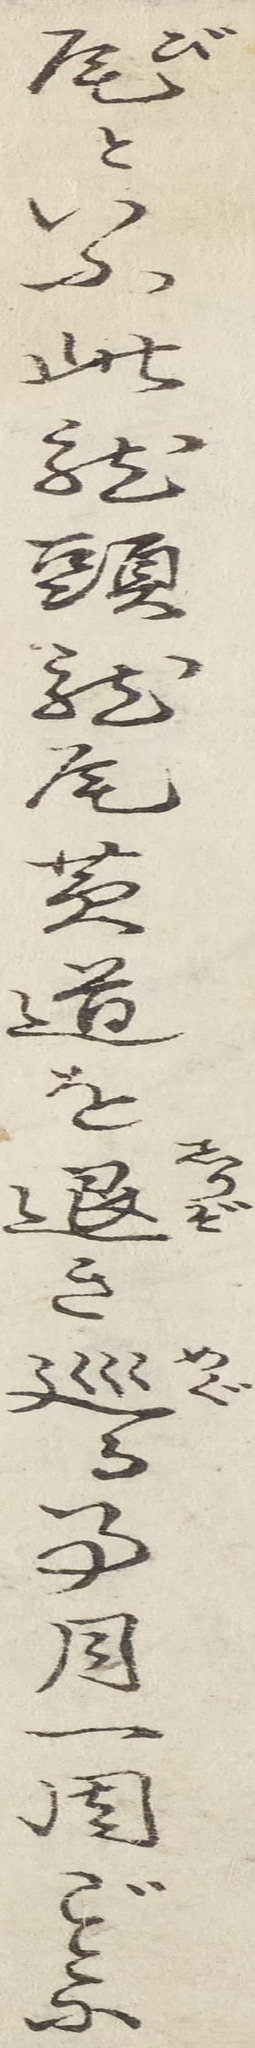尾といふ此龍頭龍尾黄道を退き巡る事月一周ごとに
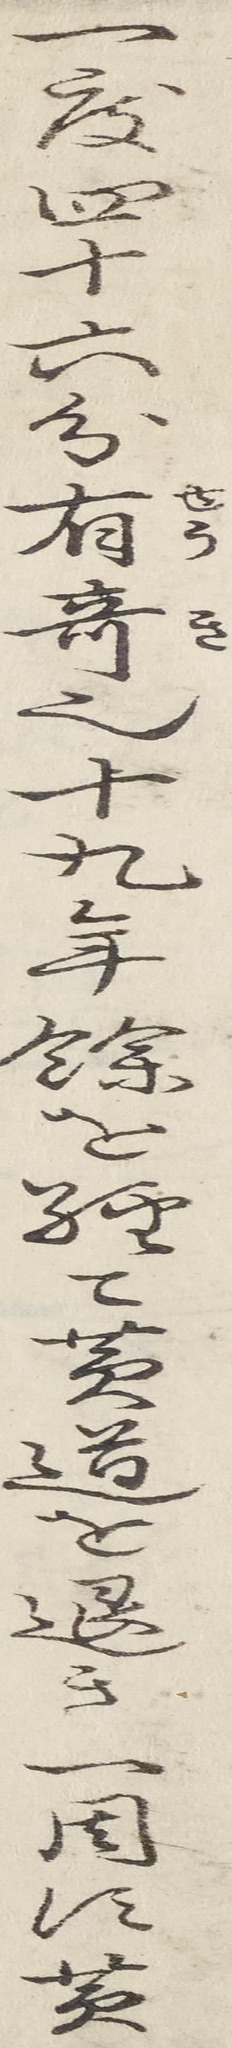一度四十六分有奇之十九年余を経て黄道を退き一周す黄
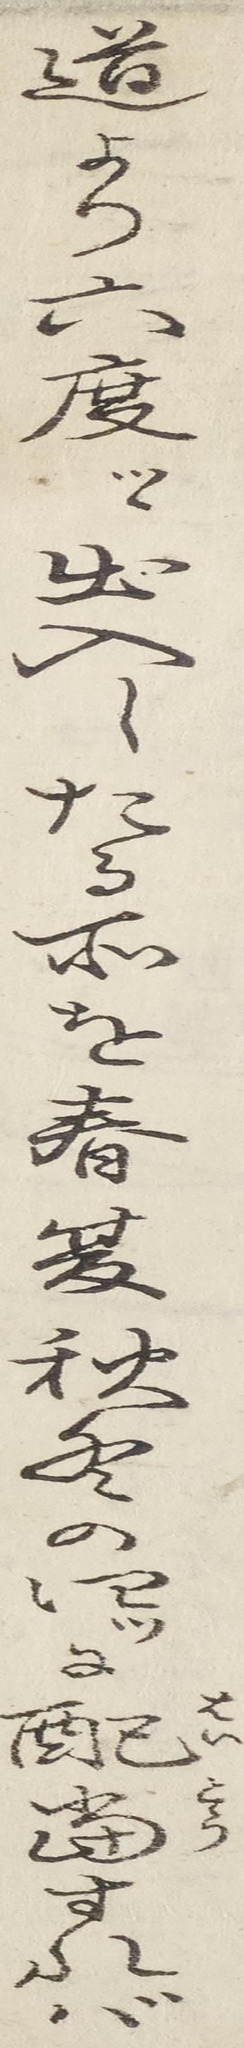道より六度つゝ出入したる所を春夏秋冬の四つに配当すれば
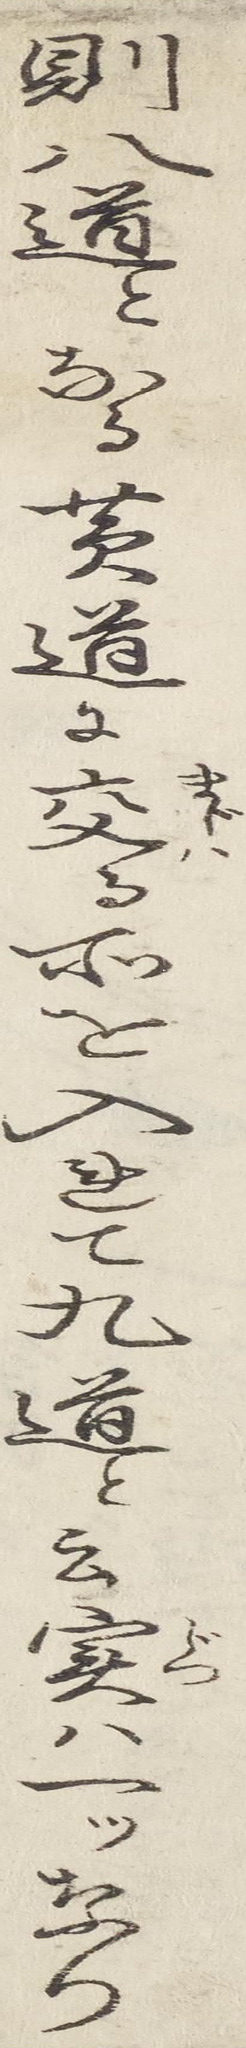則八道となる横道に交る所を入れて九道と云実は一つなり
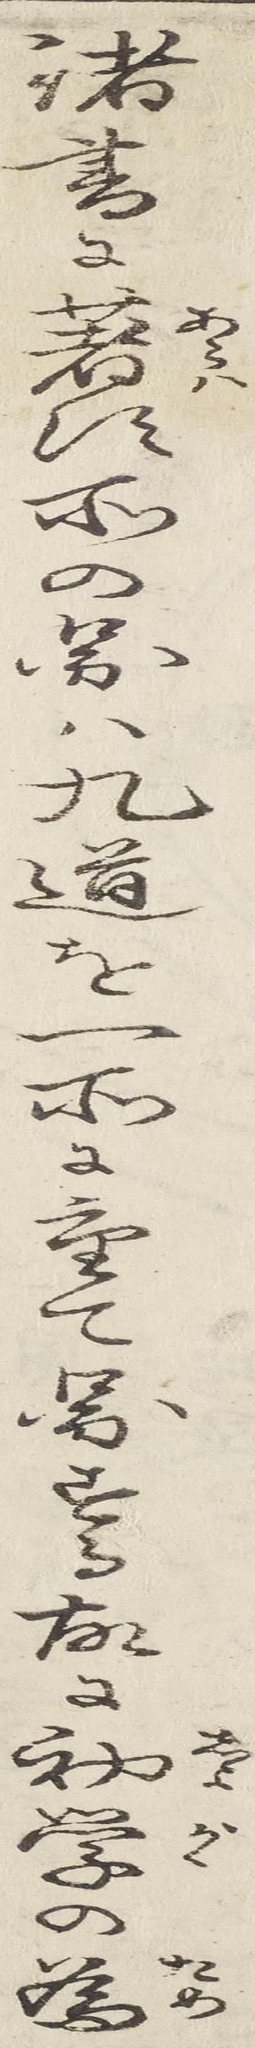諸書に著す所の図は九道を一所に重て図する故に初学の為
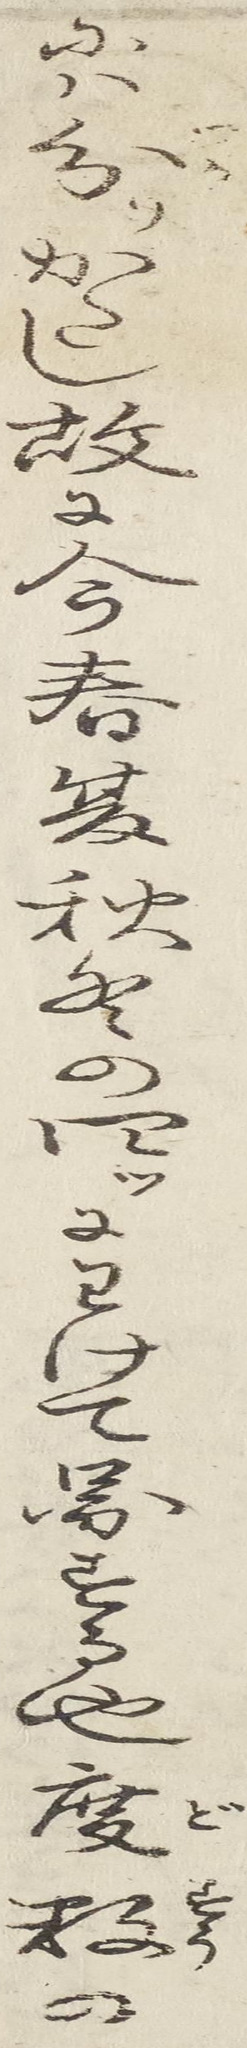には分りかたし故に今春夏秋冬の四つにわけて図する也度数の
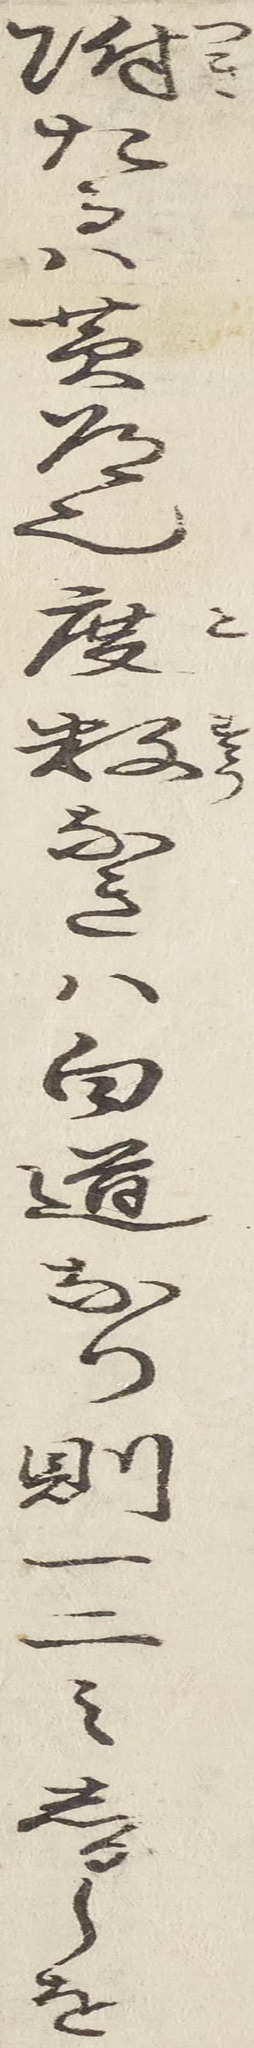附たるは黄道也度数なきは白道なり則一二之しるしを
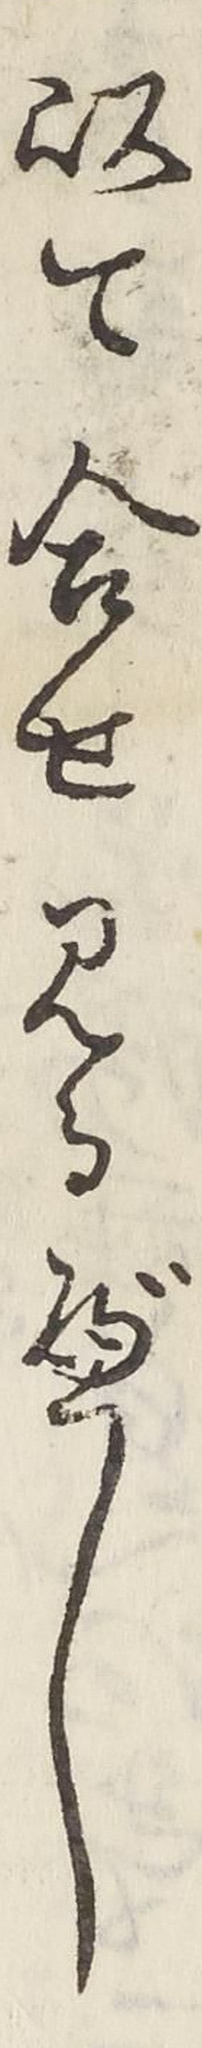以て合せ見るべし
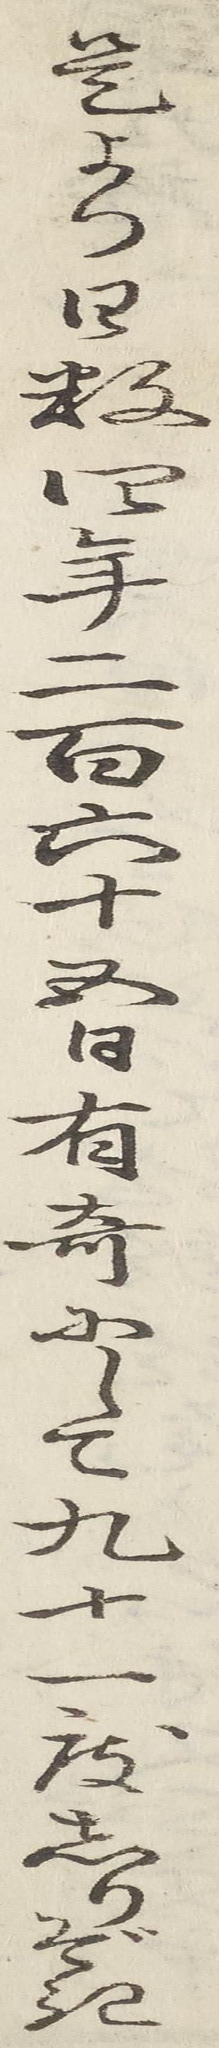是より日数四年二百六十五日有奇にして九十一度しりぞき
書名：平天儀圖解
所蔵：東京大学地震研究所図書室 Earthquake Research Institute Library, The University of Tokyo, JAPAN
